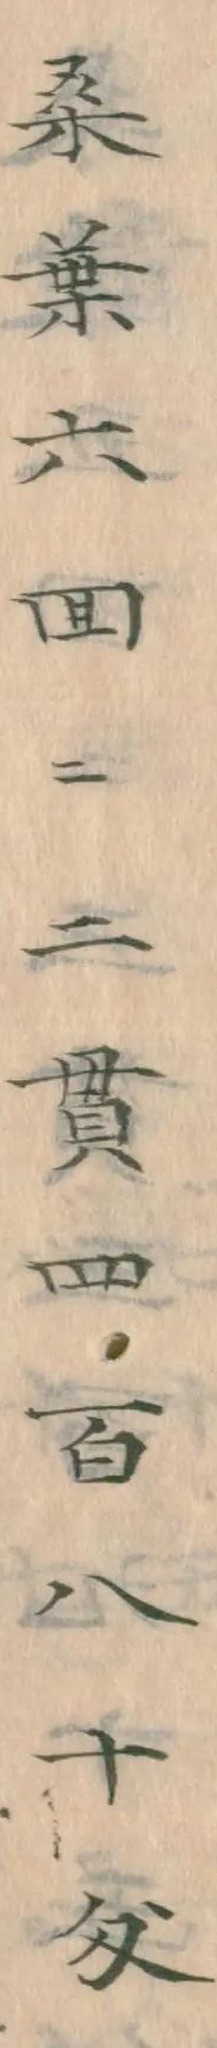桑葉六回ニ二貫四百八十匁
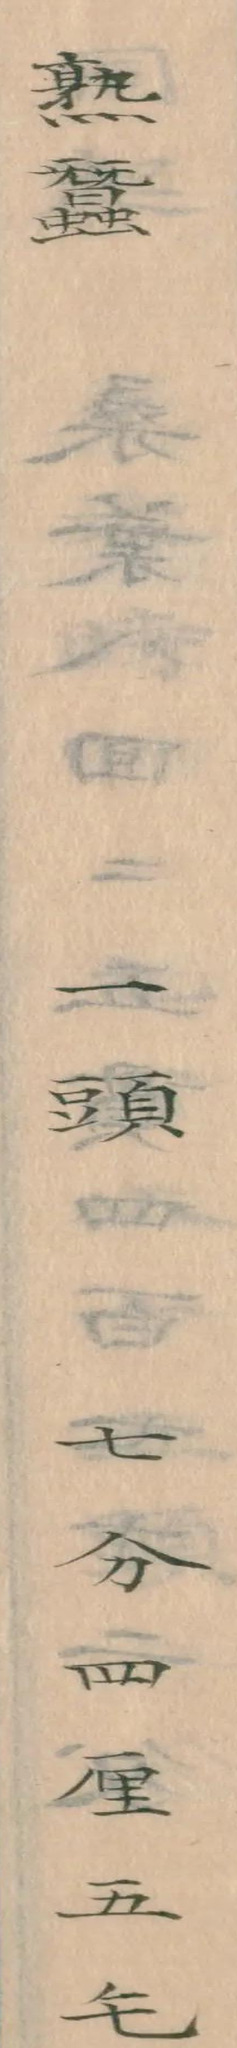熟蚕一頭七分四厘五毛
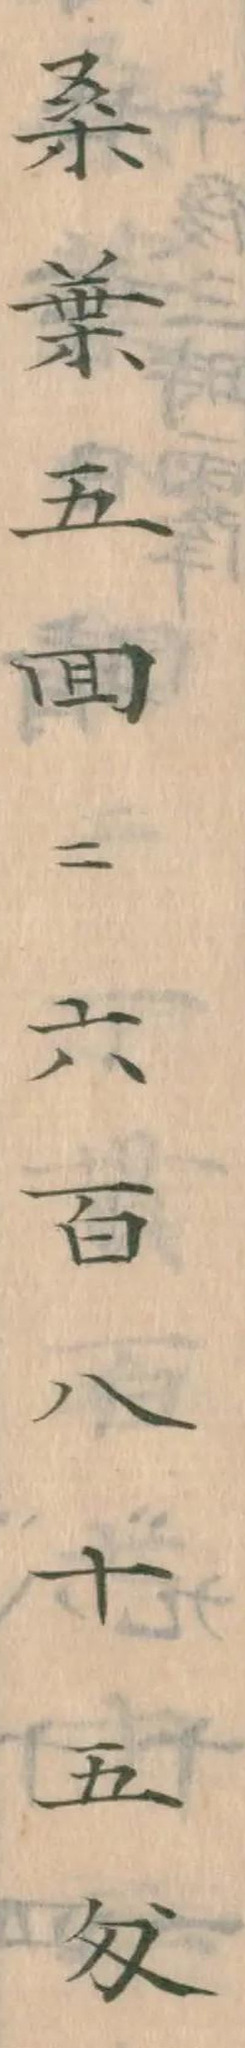桑葉五回ニ六百八十五匁
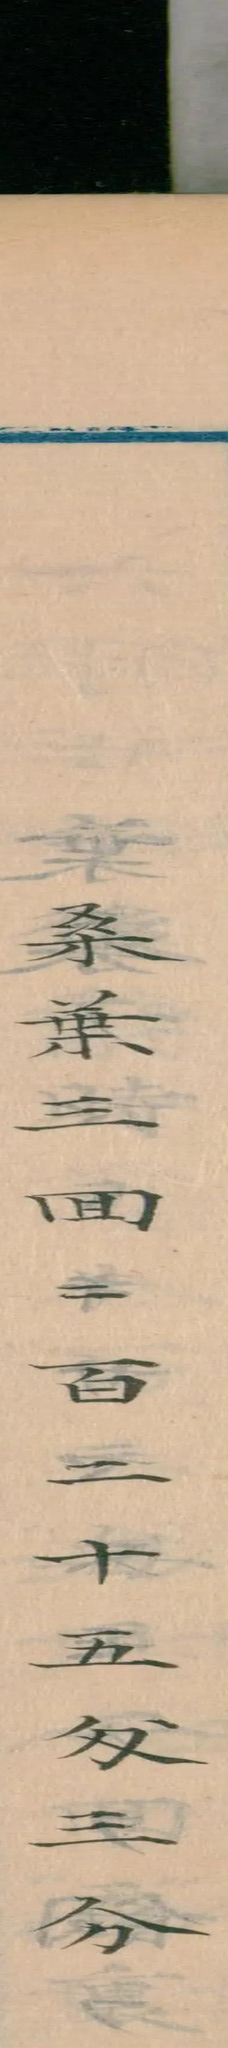桑葉三回ニ百二十五匁三分
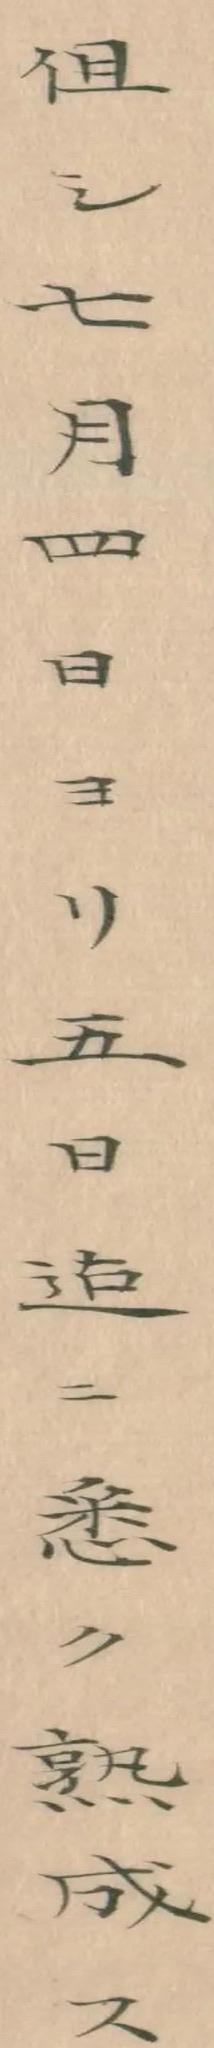但シ七月四日ヨリ五日迄ニ悉ク熟成ス

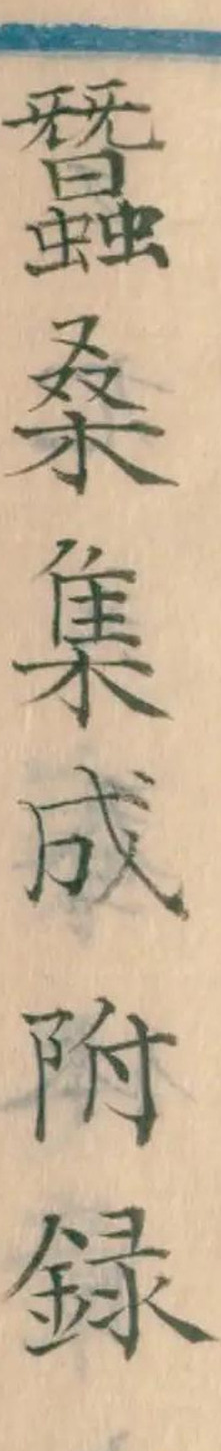蚕桑集成附録
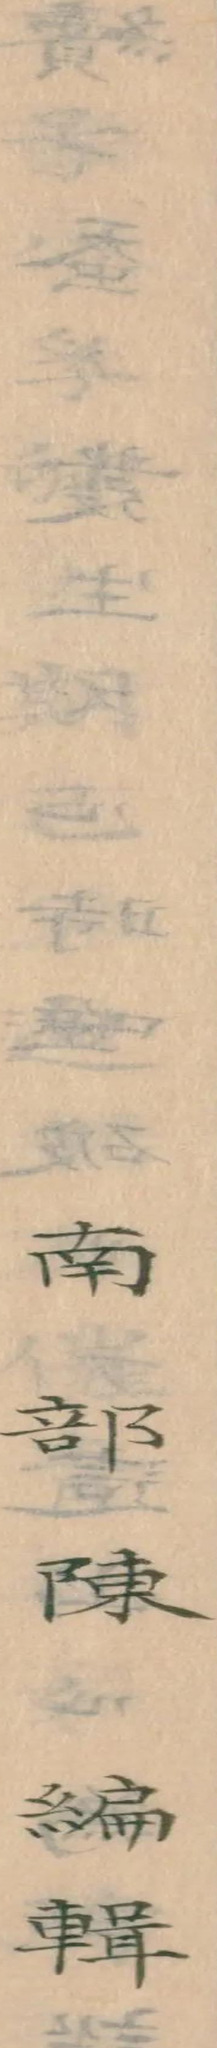南部陳編輯
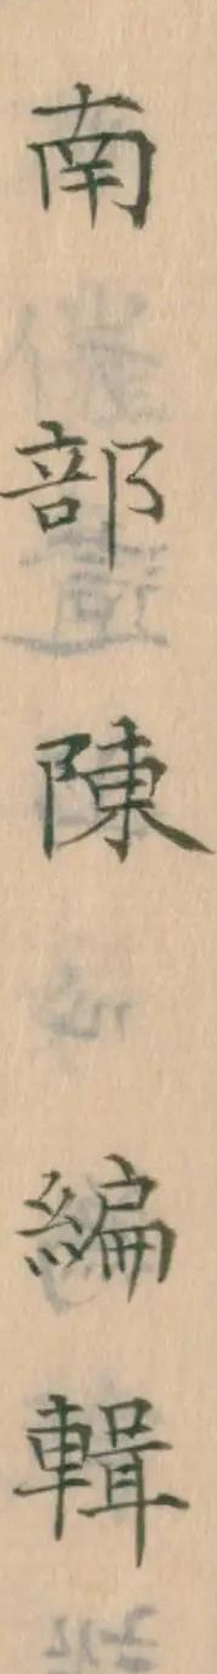南部陳編輯
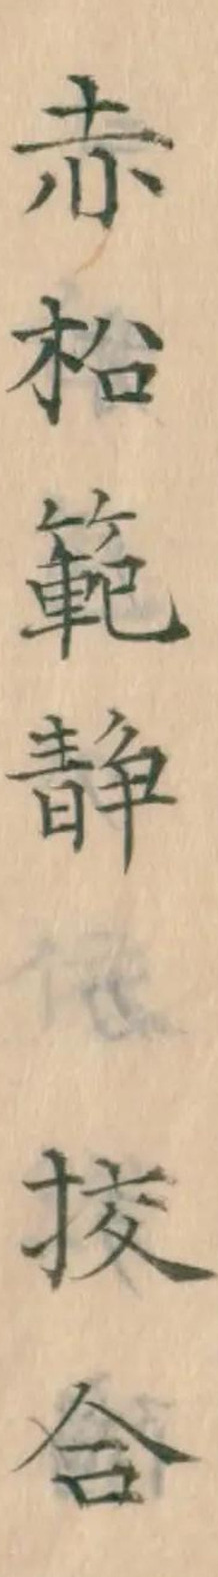赤松範静挍合
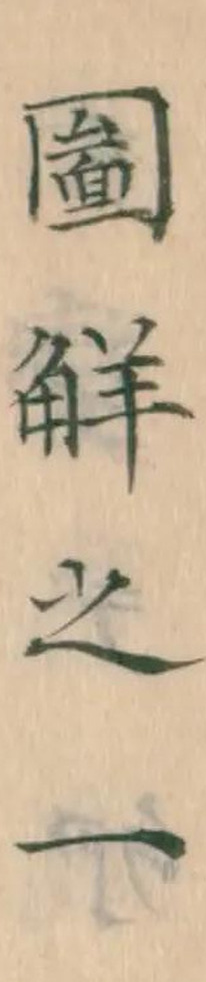図解之一
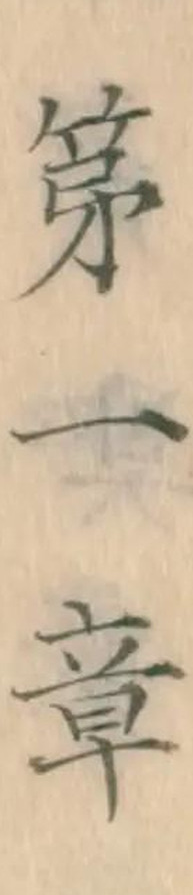第一章
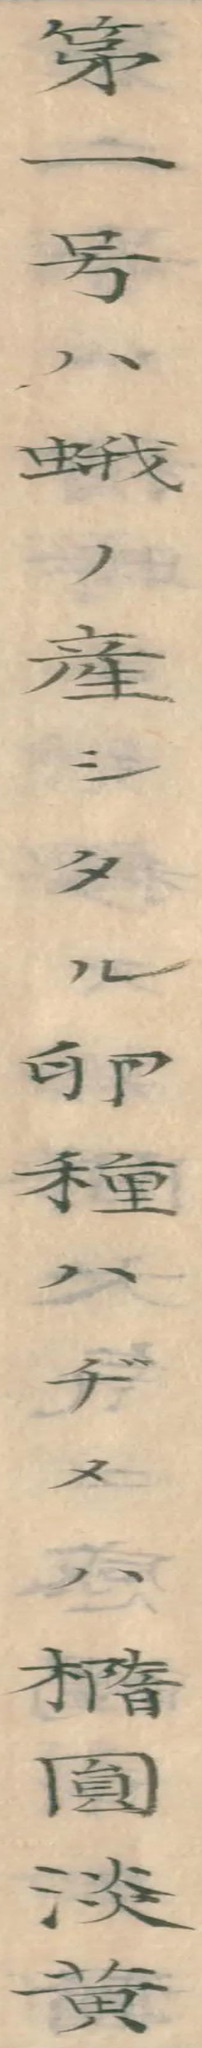第一号ハ蛾ノ産シタル卵種ハヂメハ楕円淡黄
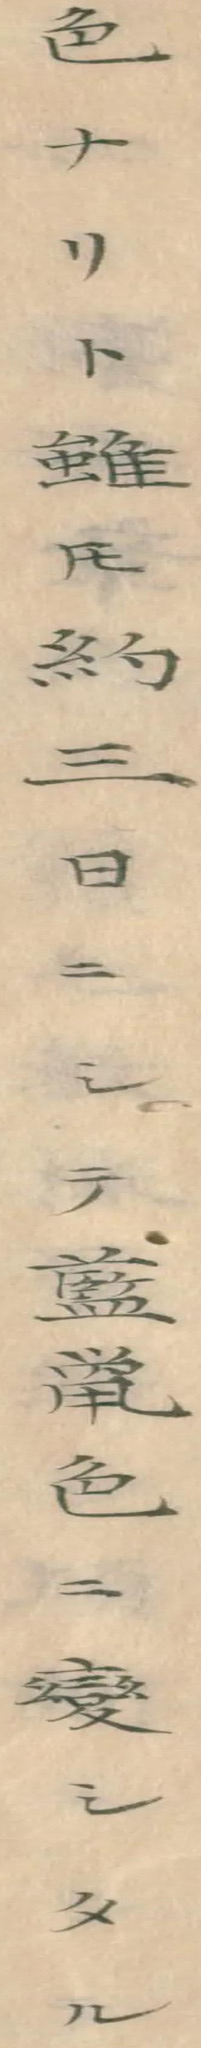色ナリト雖トモ約三日ニシテ藍鼠色ニ変シタル
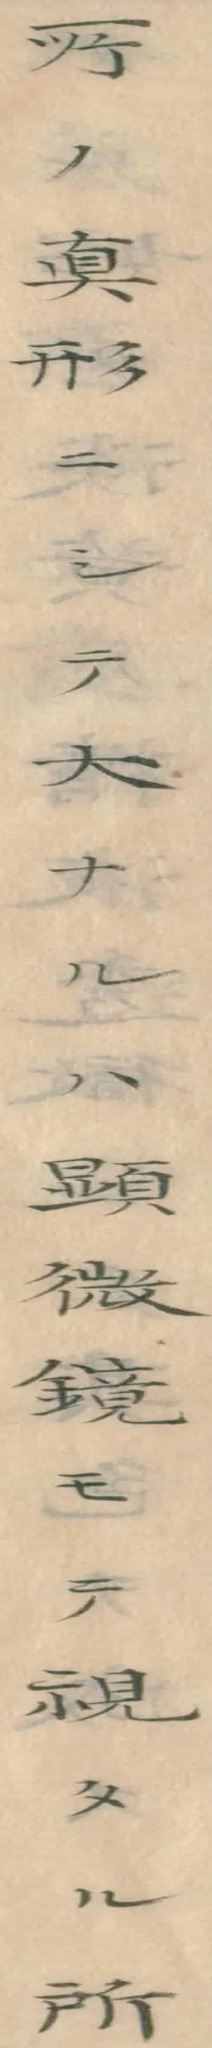所ノ真形ニシテ大ナルハ顕微鏡モテ視タル所
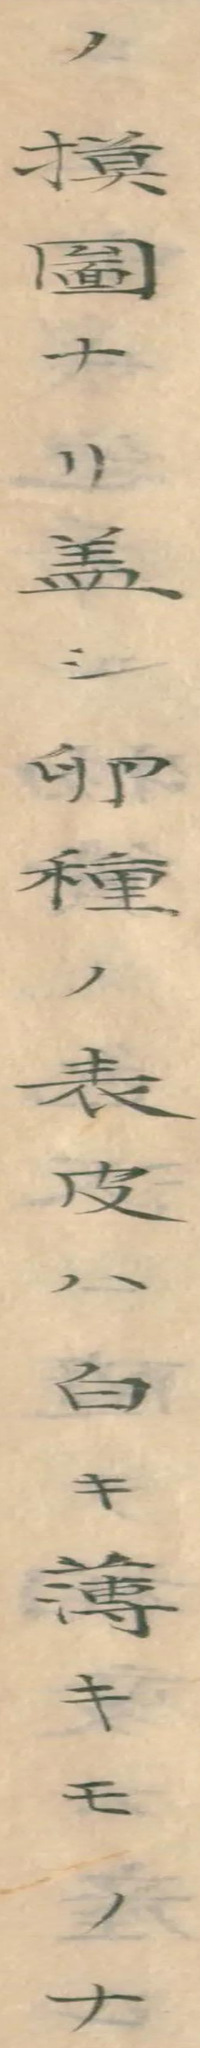ノ模図ナリ蓋シ卵種ノ表皮ハ白キ薄キモノナ

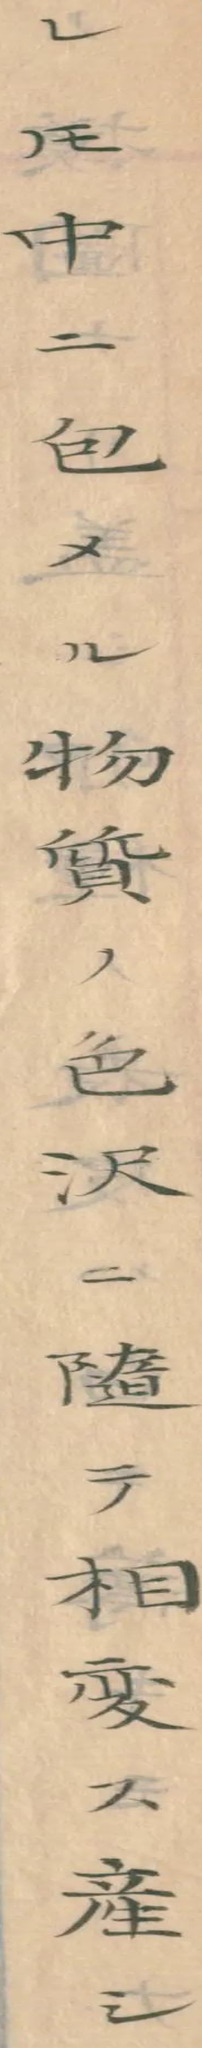レトモ中ニ包メル物質ノ色沢ニ随テ相変ス産シ
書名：蚕桑集成
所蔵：国立国会図書館 National Diet Library, JAPAN
